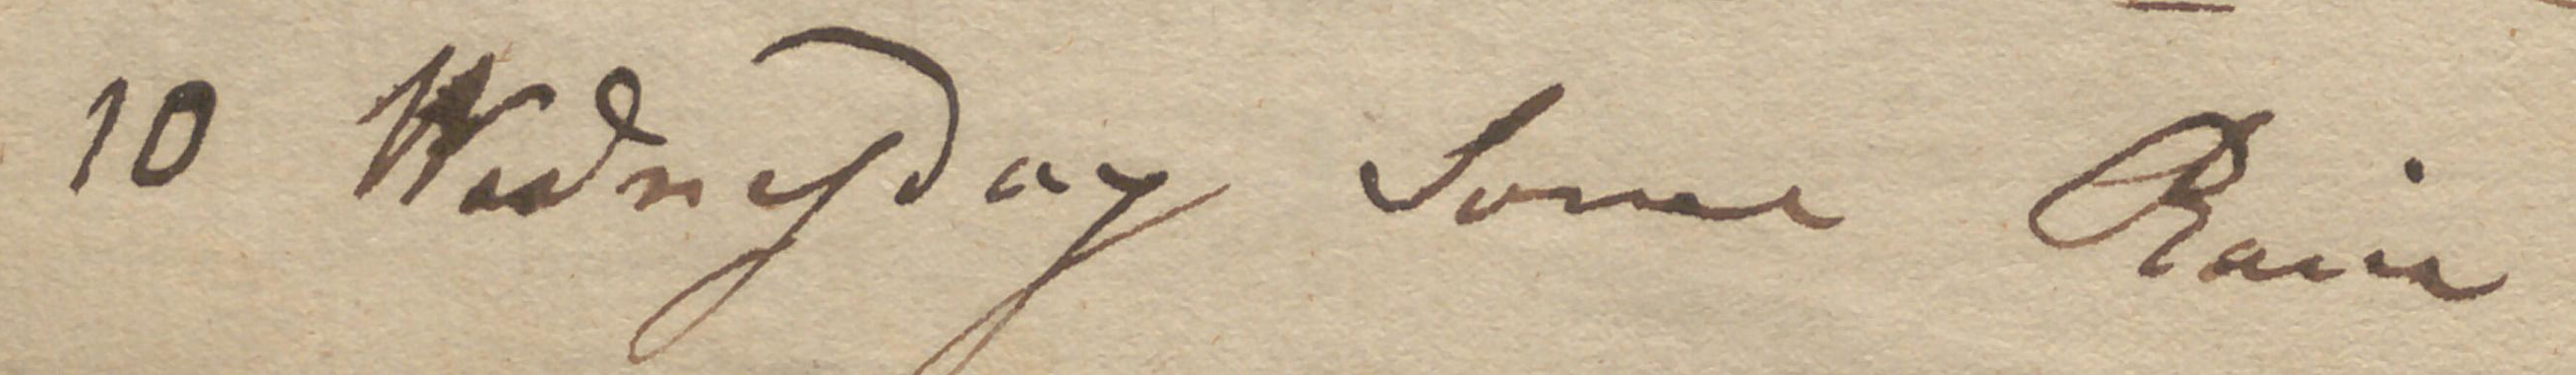10 Wednesday some Rain
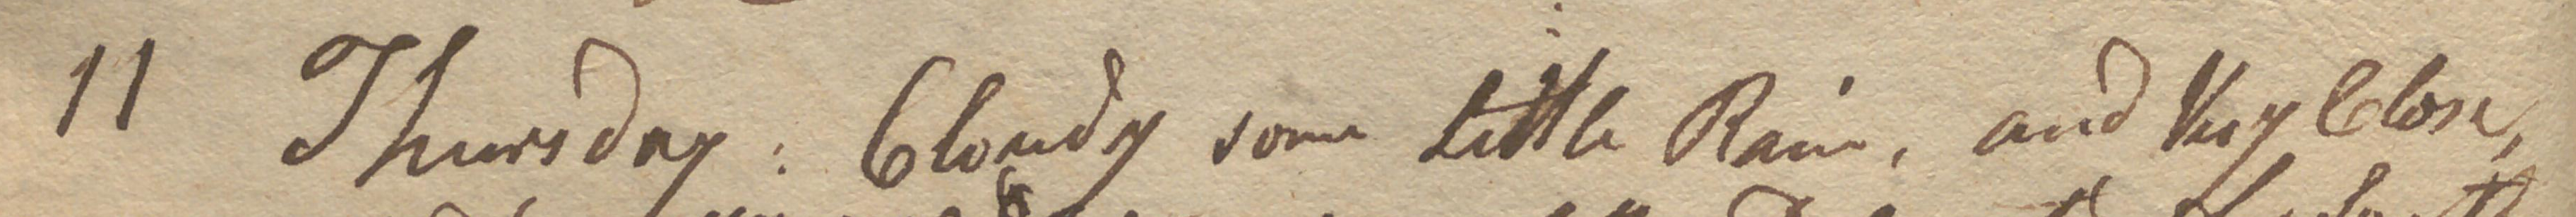11 Thursday. Cloudy sone Little Rain, and Very Close,
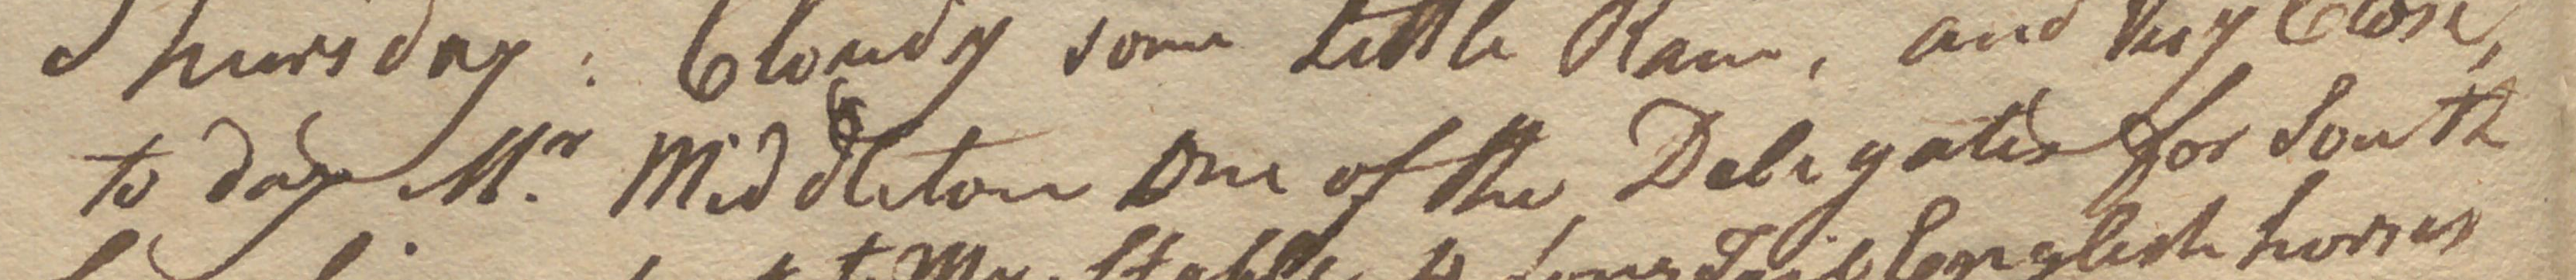to day M^r. Middleton one of the Deligates for South
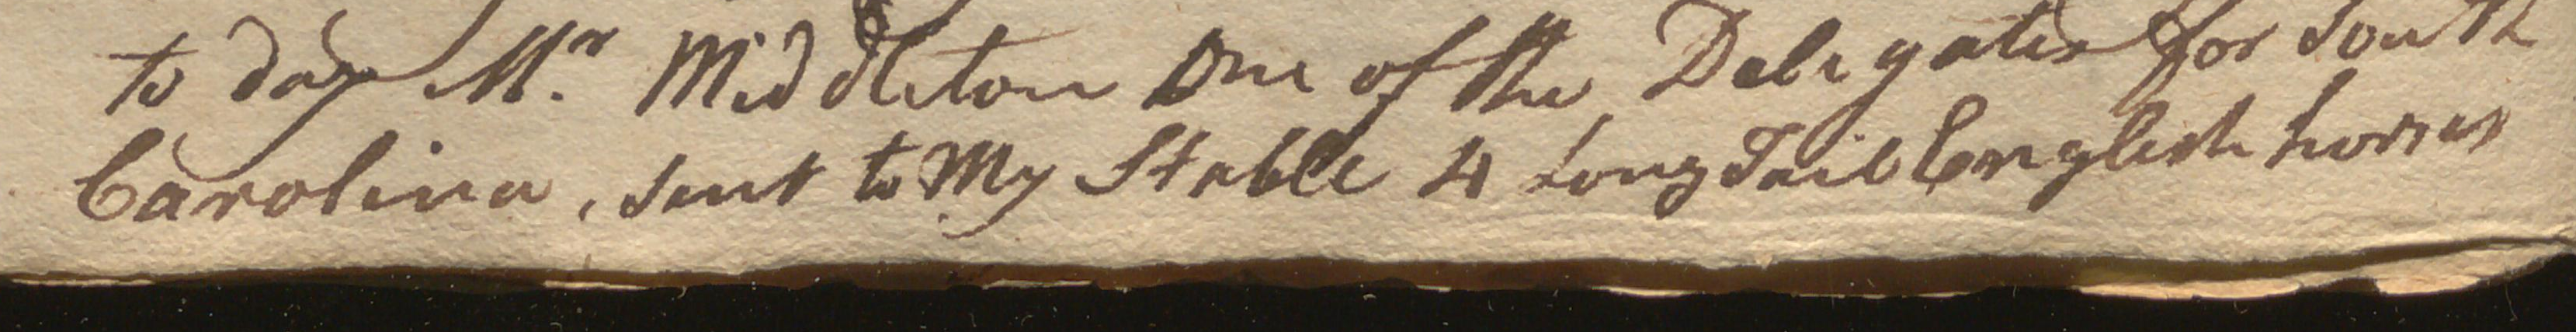Carohensw, sent to My Stable 4 Long Tail English horses
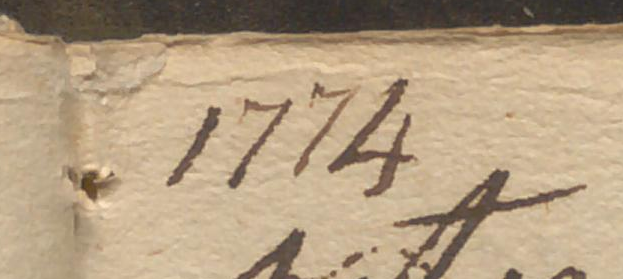1774
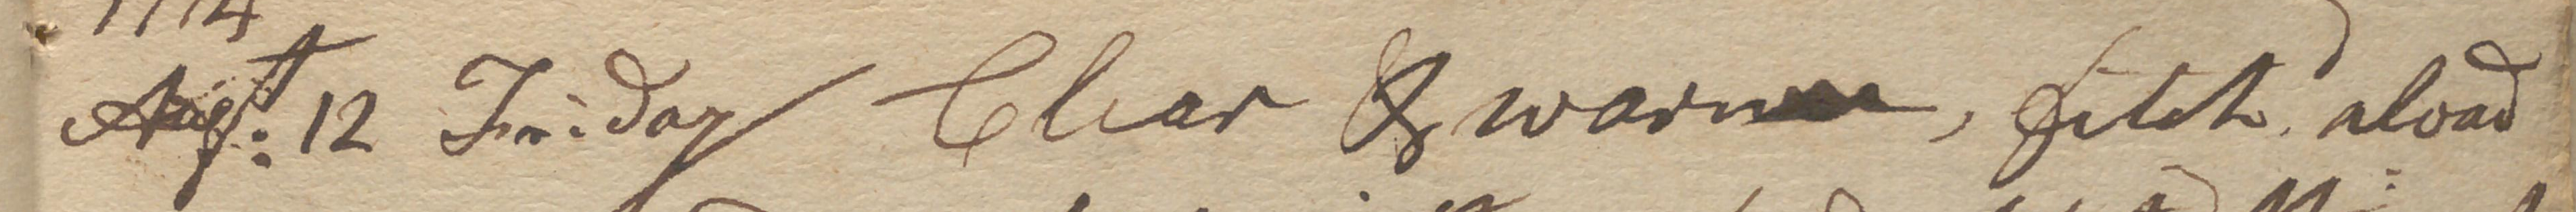Aug^t: 12 Friday Clear & warme, fetchd a load
